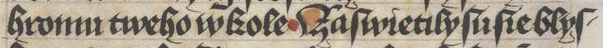hromu tweho wkole.Zaſwietily ſu ſie blyſ¬
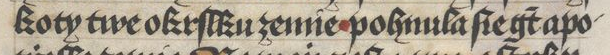koty twe okrſlku zemie.pohnula ſie ḡt apo¬
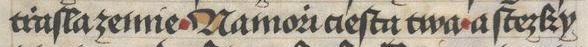tṙaſla zemie.Namoṙi cieſta twa.a ſtezky
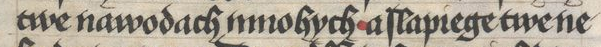twe nawodach mnohych.a ẛlapiege twe ne¬
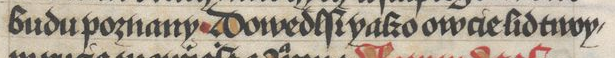budu poznany.Dowedlſi yako owcie lidtwy
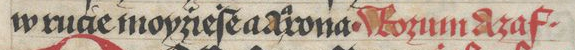w rucie moyżieẛe a Aarona.Rozum Azaf.
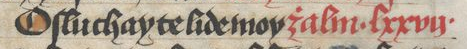Oſluchayte lide moy żalm.lxxvii.
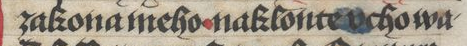zakona meho.naklonte vcho wa¬
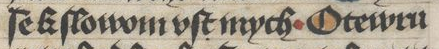ẛe k ſlowu vſt mych.Otewru
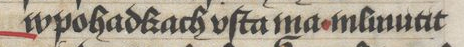wpohadkach vſta ma.mluuitit
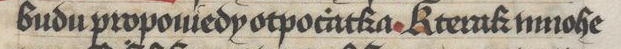budu propouiedy otpoċatka.Kterak mnohe
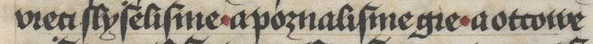vieci ſlyẛeliſme.a poznaliſme gie.a otcowe
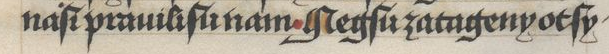naẛi prauiliſu nam.Negſu zatageny otſy¬
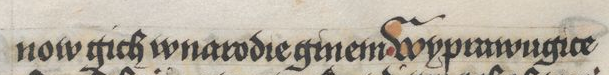now gich wnarodie ginem.Wyprawugice
